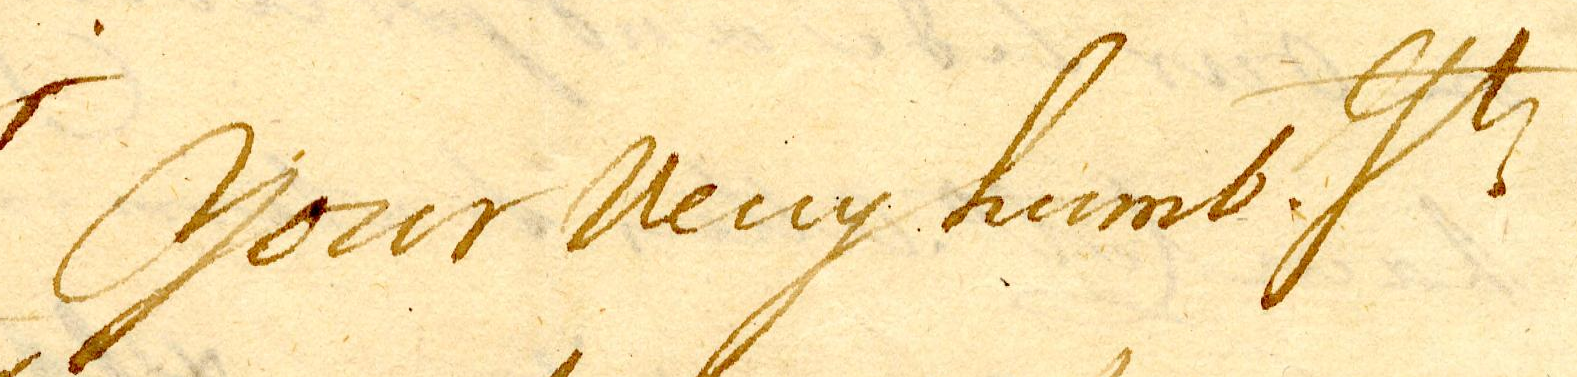Your very humb. S^t
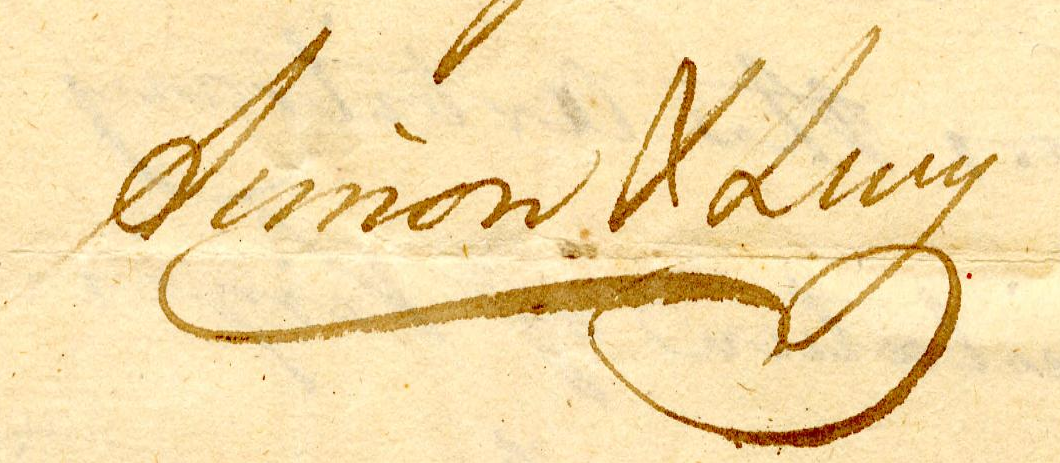Simon & Levy
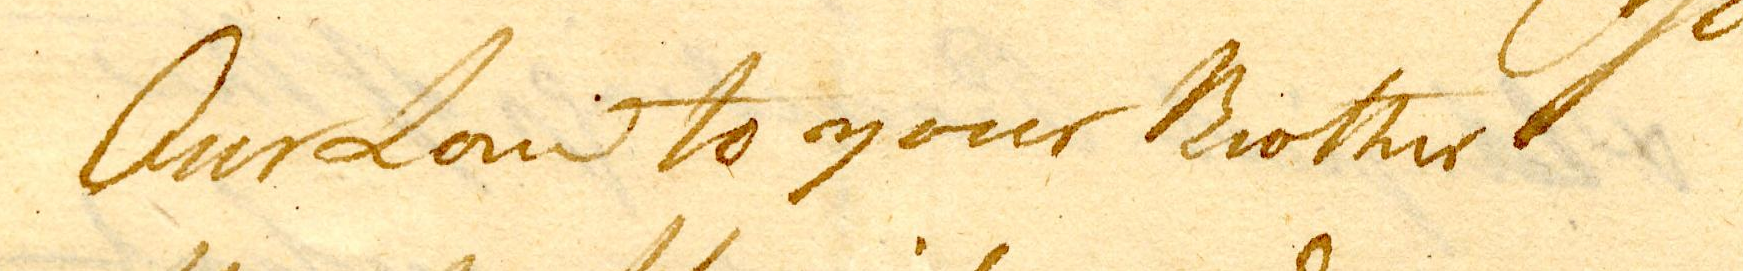Our Love to your Brother
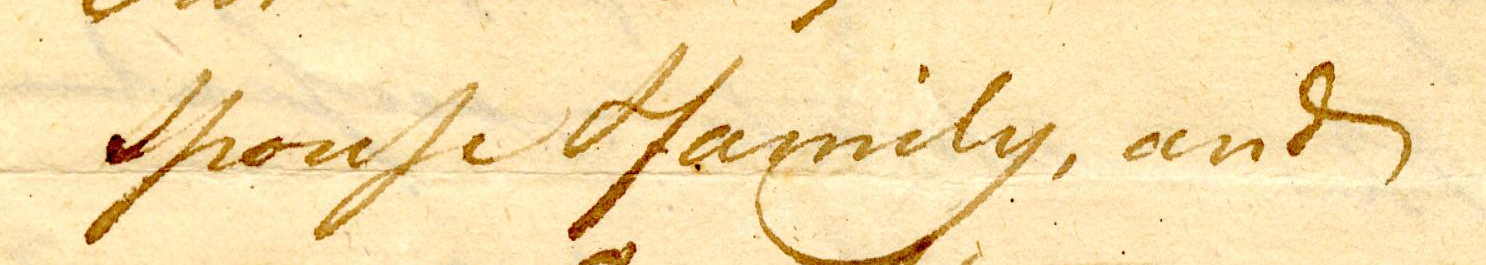Spouse & family, and
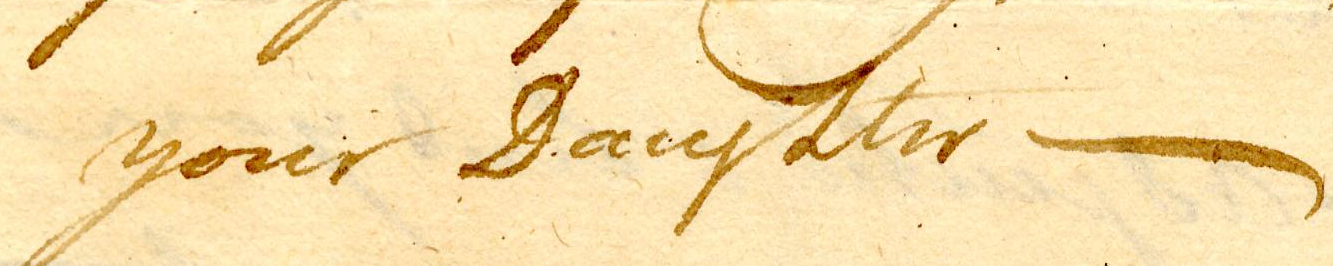your Daughter
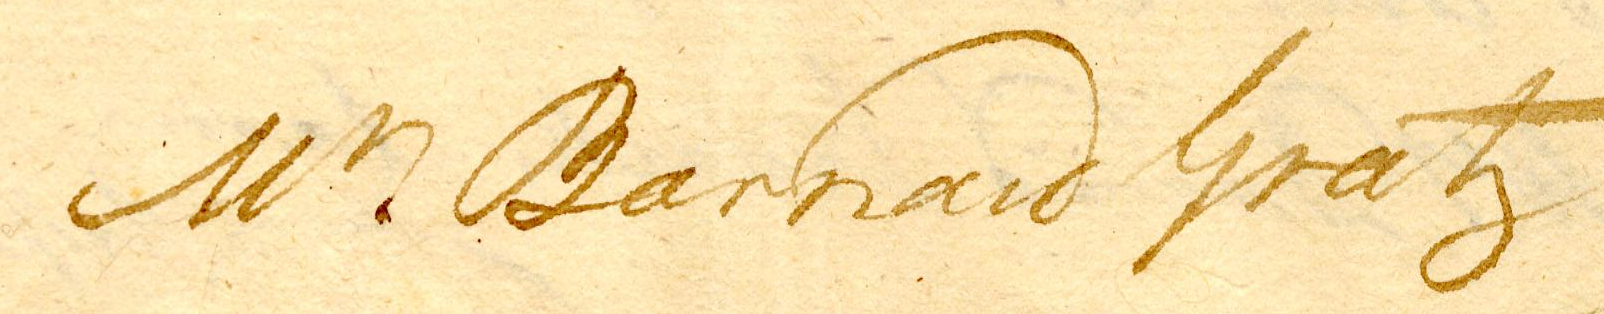M^r Barnard Gratz
